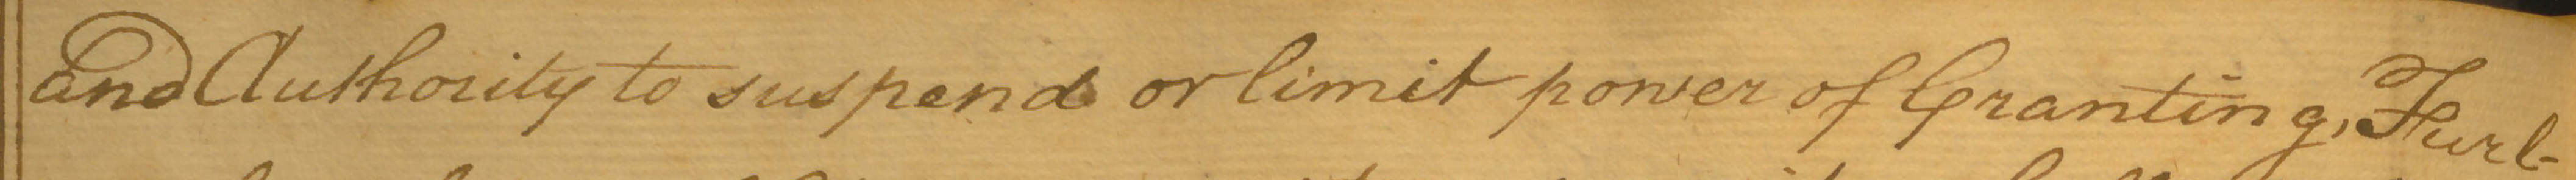and Authority to suspend or limit power of Granting, Furl-
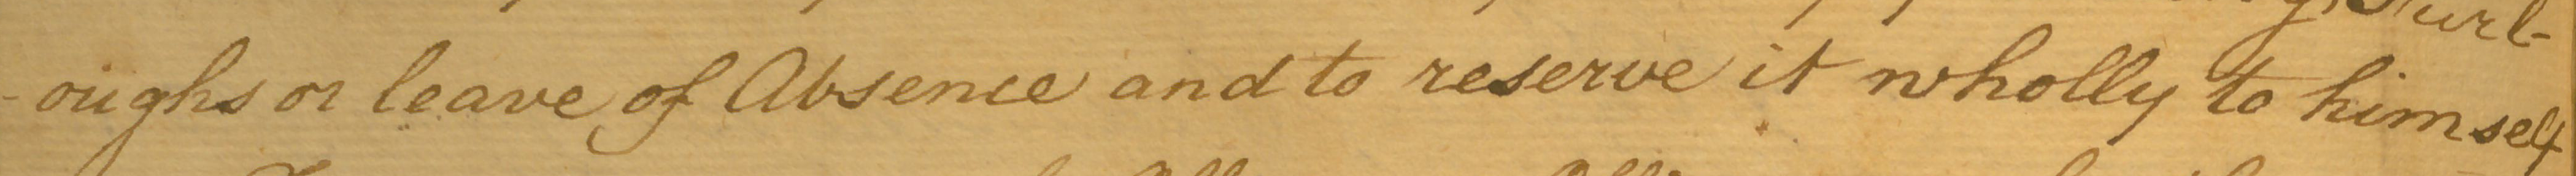oughs or leave of Absence and to reserve it wholly to himself
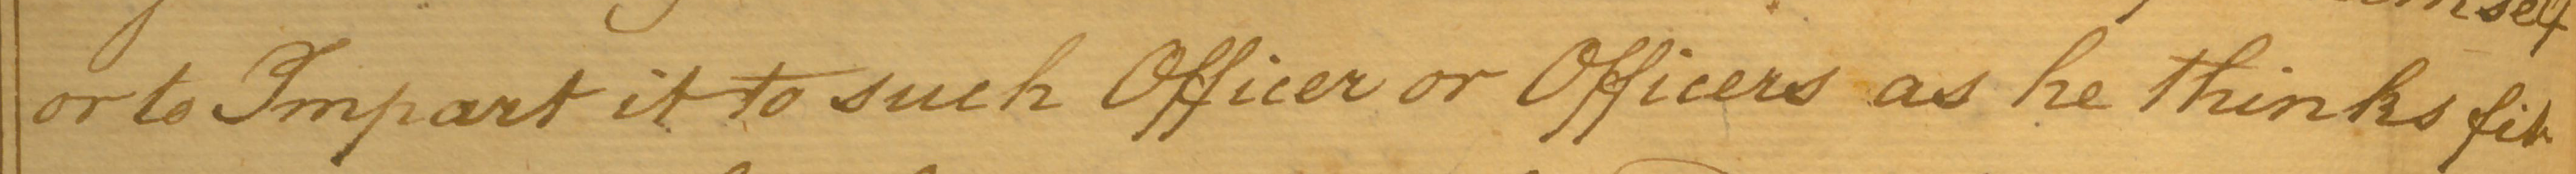or to Impart it to such Officer of Officers as he thinks fit
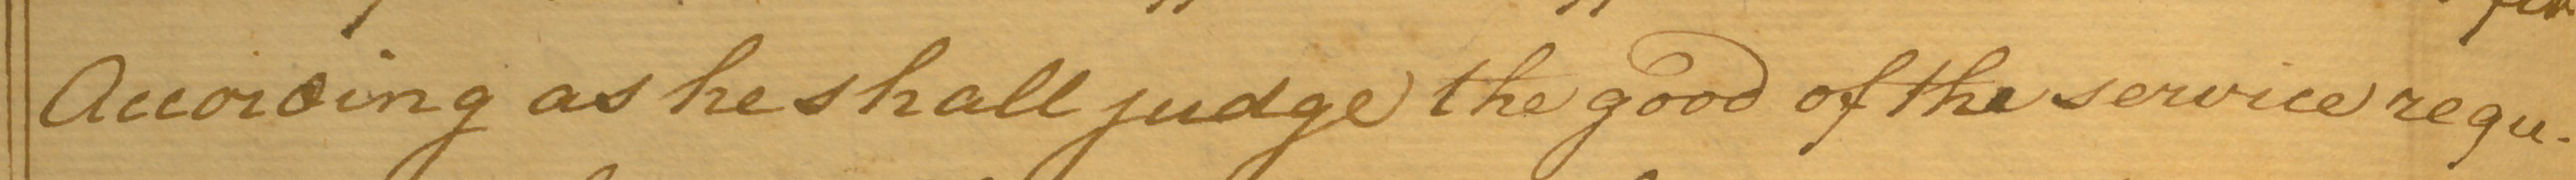According as he shall judge the good of the service requ-
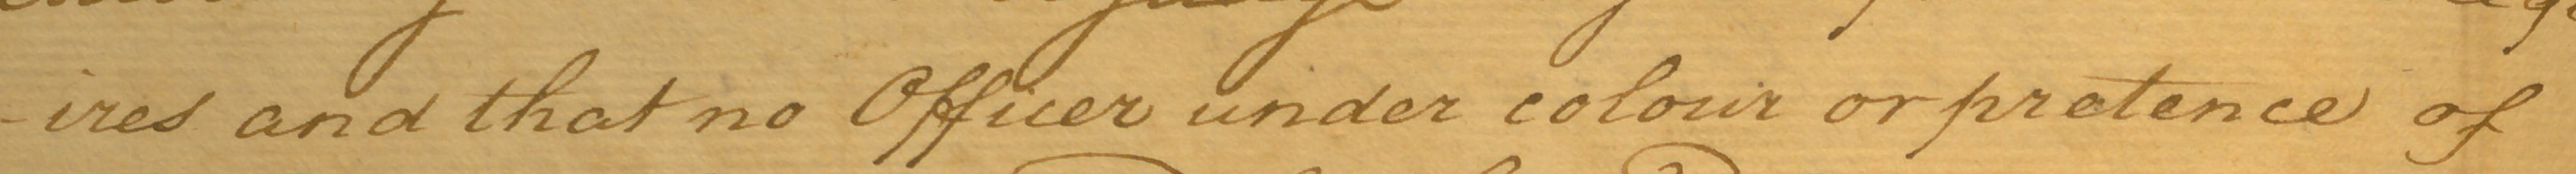-ires and that no Officer under colour or pretence of
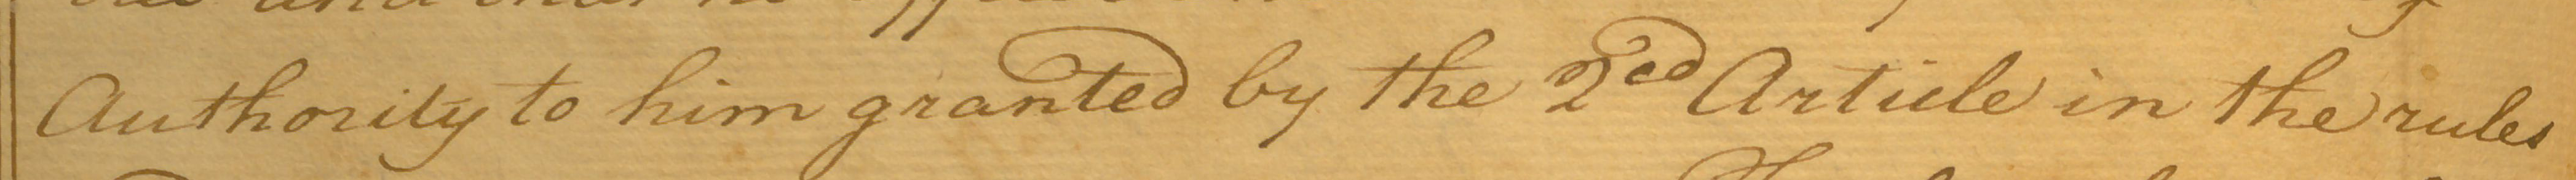Authority to him granted by the 2^nd Article in the rules
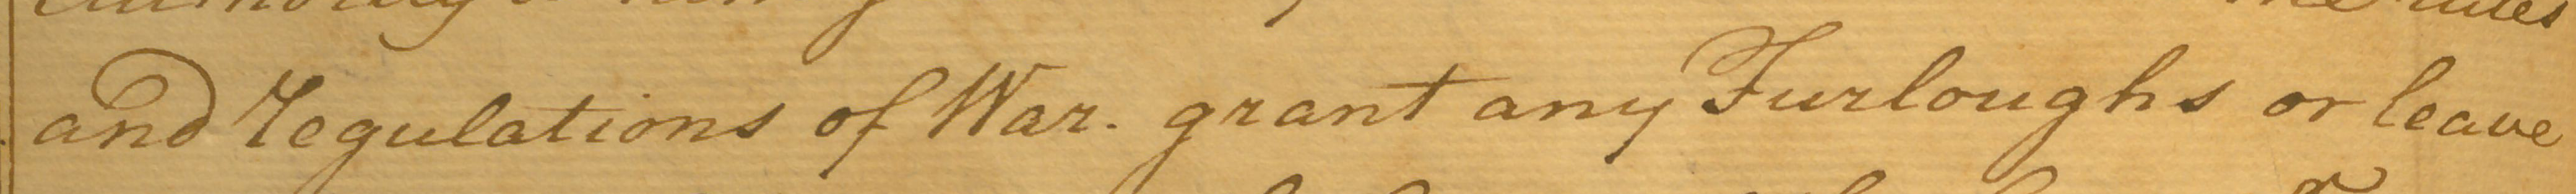and regulations of War. grant any Furloughs or leave
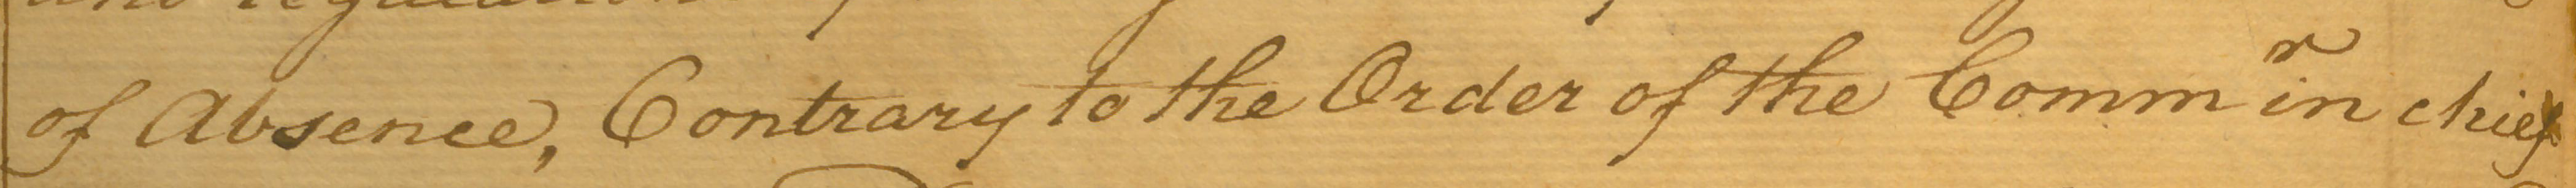of Absence, Contrary to the Order of the Comm^r in chief
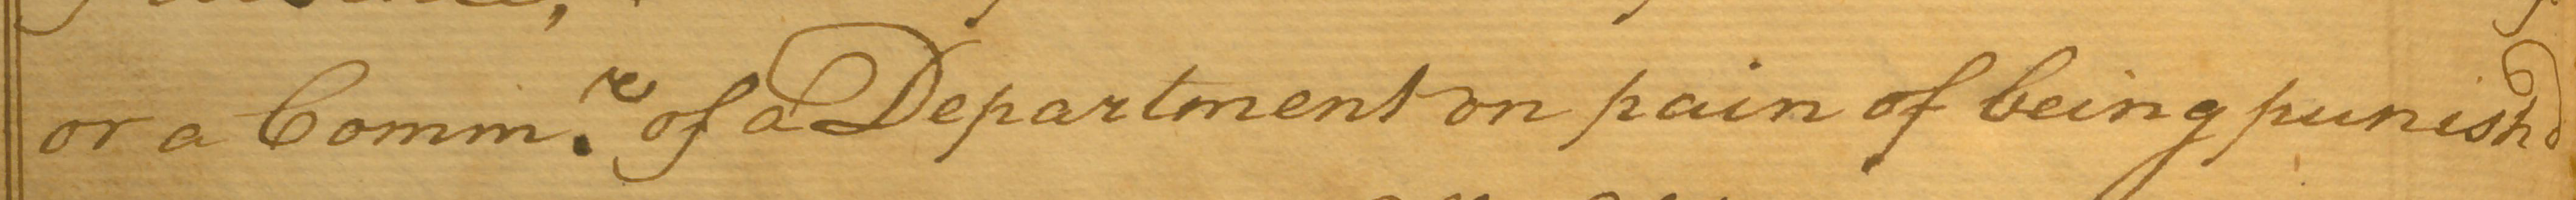or a Comm^r. of a Department on pain of being punish'd
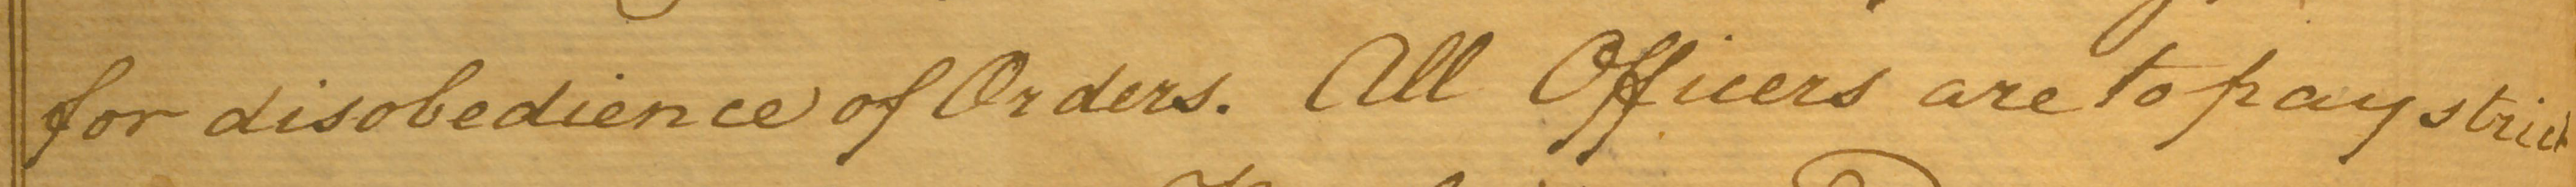for disobedience of Orders. All Officers are to pay strict
